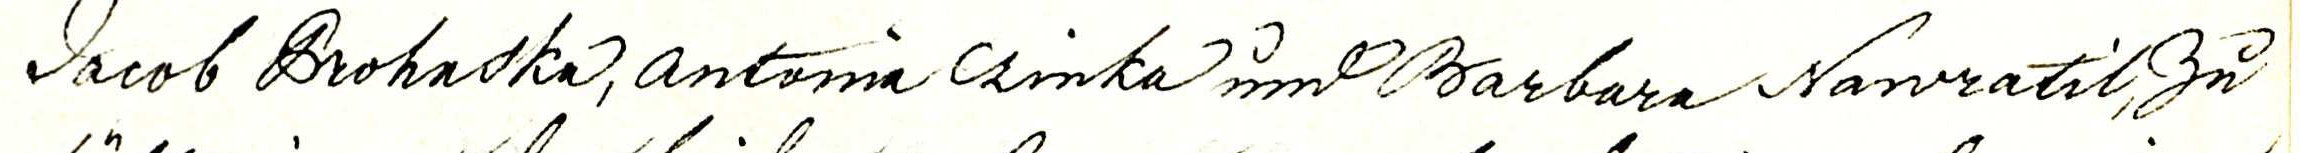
Jacob Prohaska, Antonia Czinka und Barbara Nawratil, Zu¬
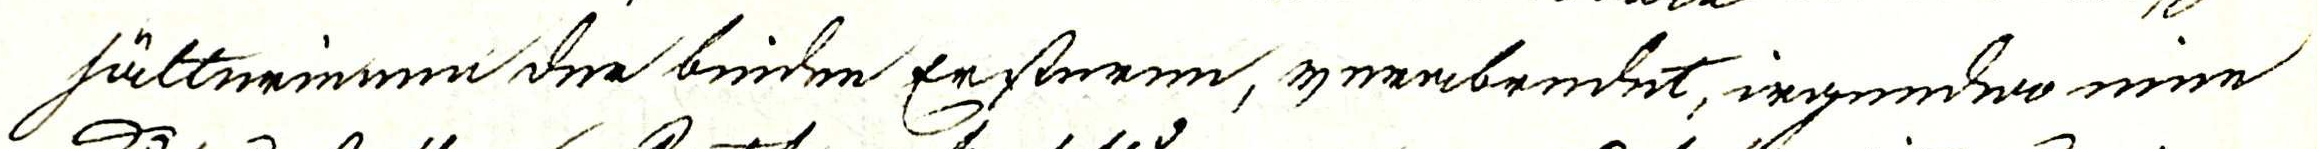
hälterinnen der beiden ersteren, verabredet, irgendwo eine
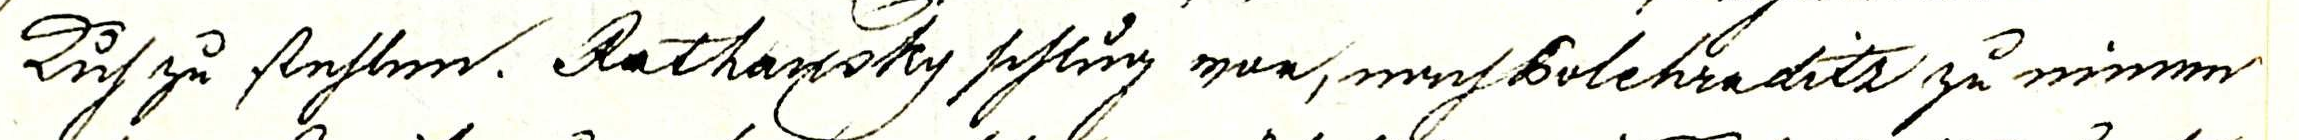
Kuh zu stehlen. Rathausky schlug vor, nach Polchraditz zu einem
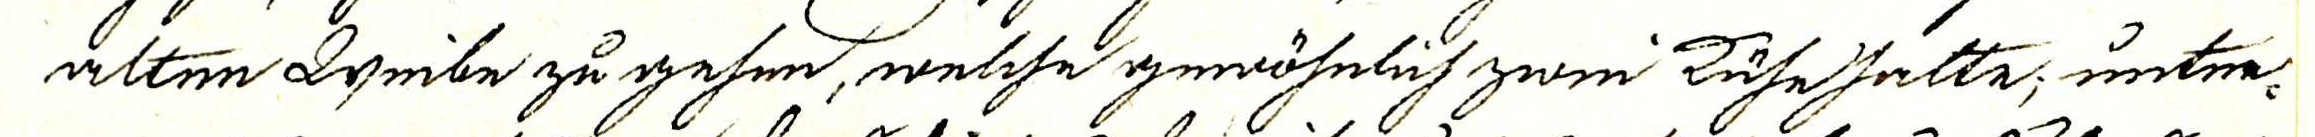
alten Weibe zu gehen, welche gewöhnlich zwei Kühe hatte, unter¬
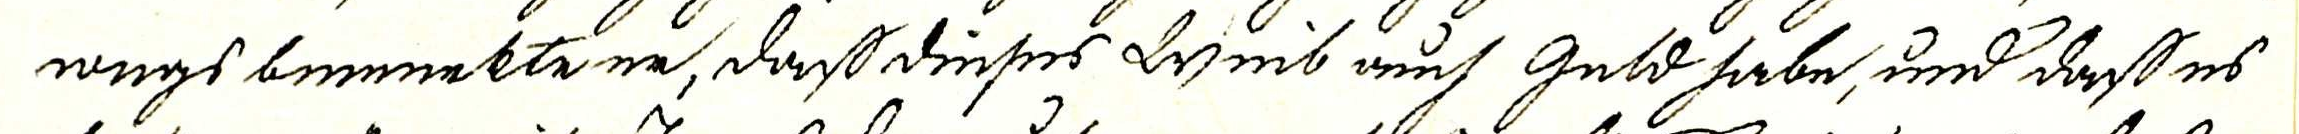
wegs bemerkte er, daß dieses Weib auch Geld habe, und daß es
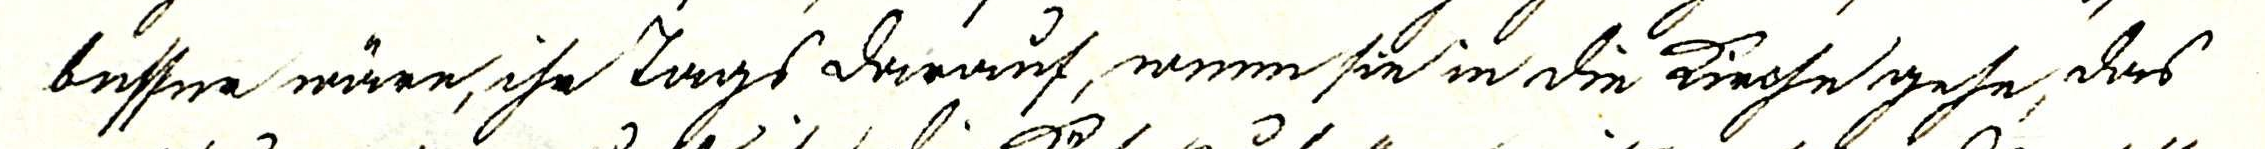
besser wäre, ihr Tags darauf, wenn sie in die Kirche gehe, das
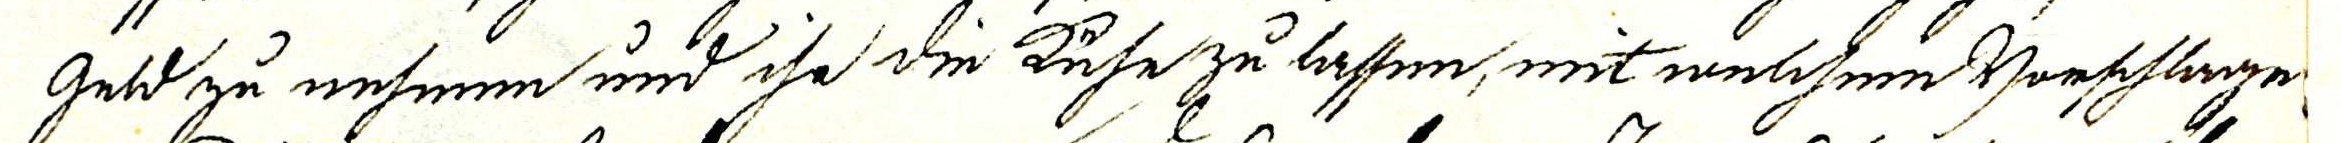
Geld zu nehmen und ihr die Kühe zu lassen, mit welchem Vorschlage
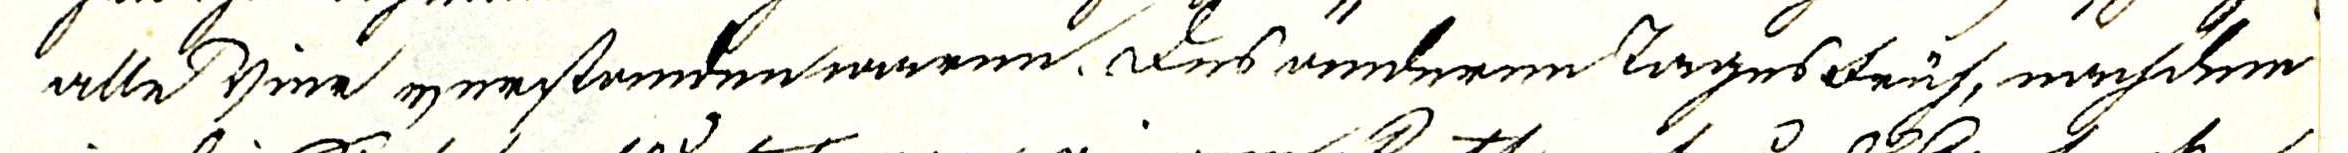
alle Vier verstanden waren. Des anderen Tages früh, nachdem
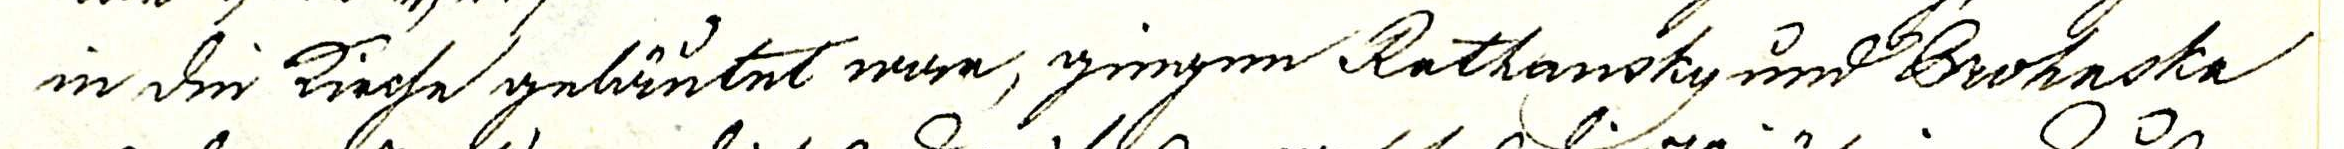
in die Kirche geläutet war, gingen Rathausky und Prohaska
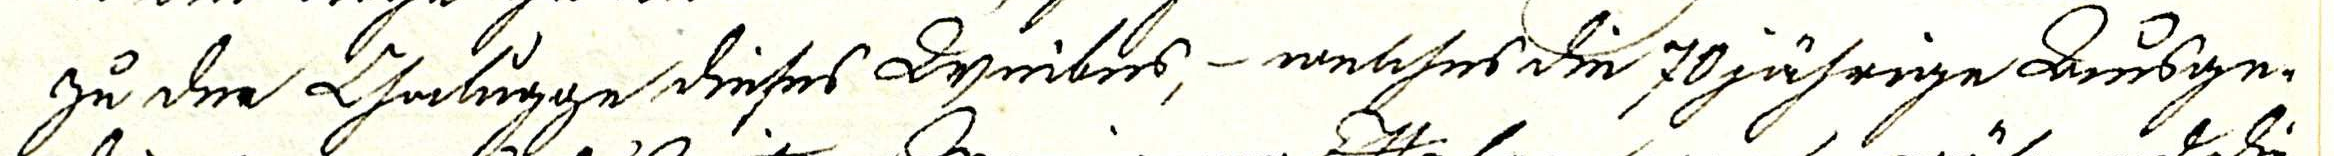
zu der Chaluppe dieses Weibes, -- welches die 70jährige Ausge¬
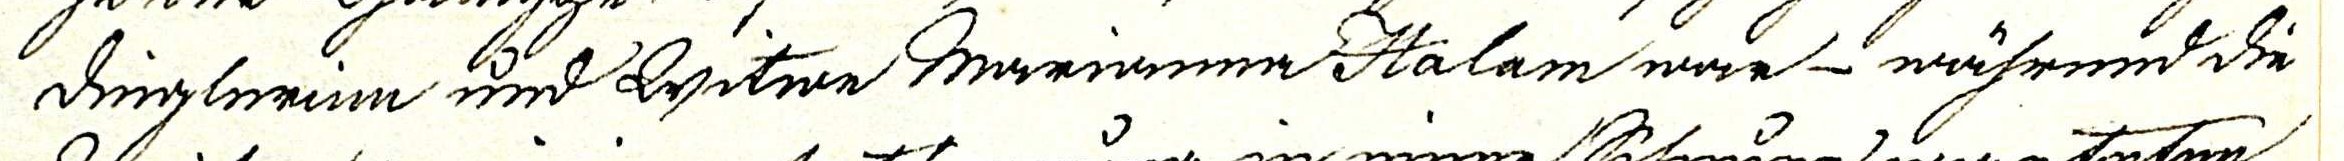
dinglerin und Witwe Marianna Halam war – während die
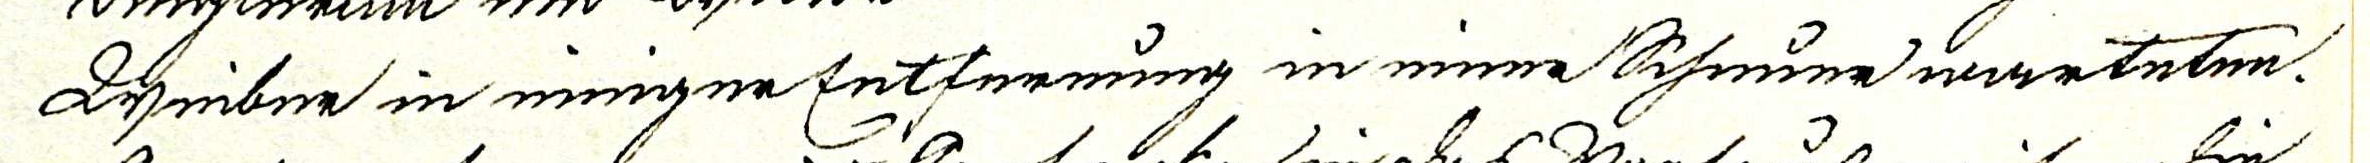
Weiber in einiger Entfernung in einer Scheune warteten.
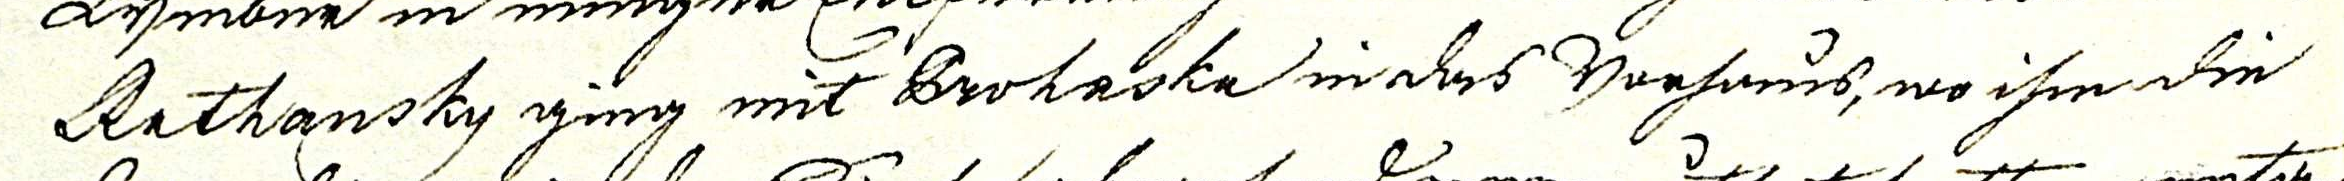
Rathausky ging mit Prohaska in das Vorhaus, wo ihm die
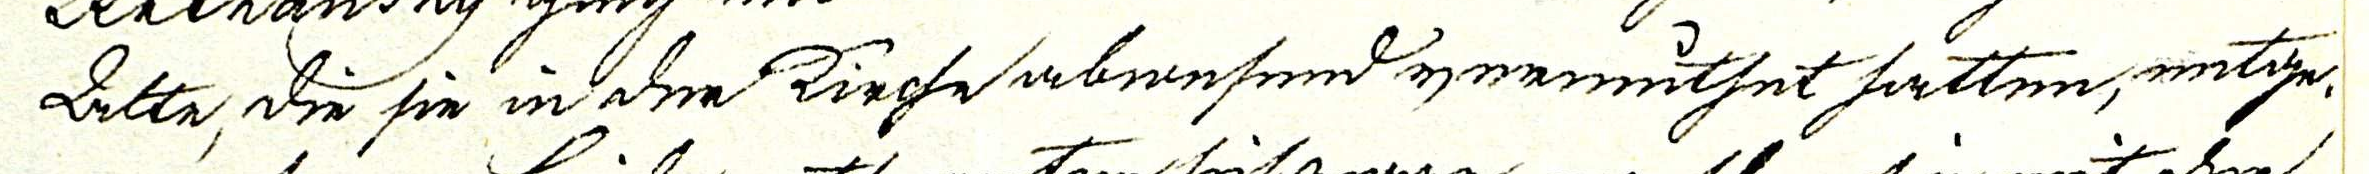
Alte, die sie in der Kirche abwesend vermuthet hatte, entge¬
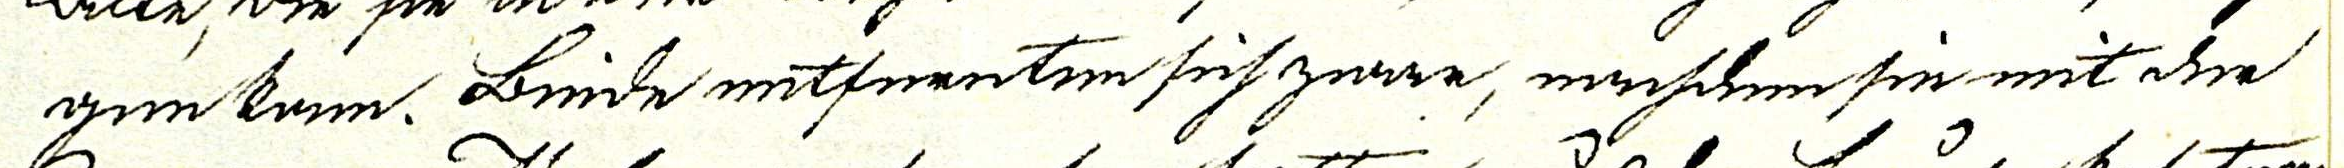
gen kam. Beide entfernten sich zwar, nachdem sie mit der
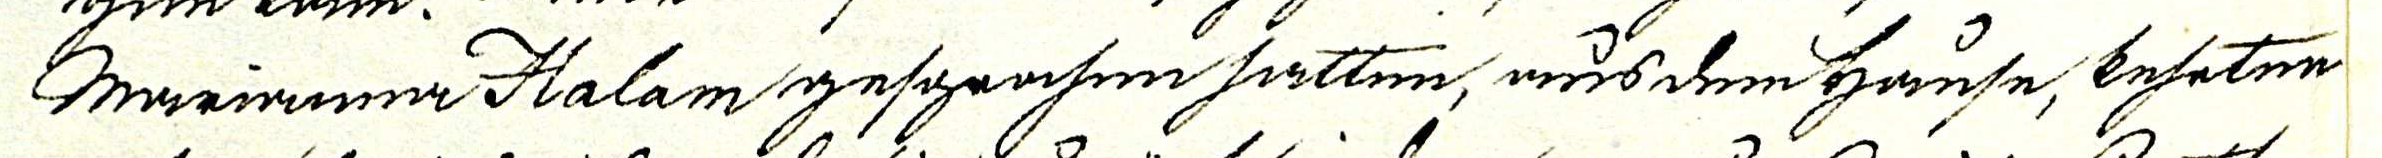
Marianna Halam gesprochen hatten, aus dem Hause, kehrten
